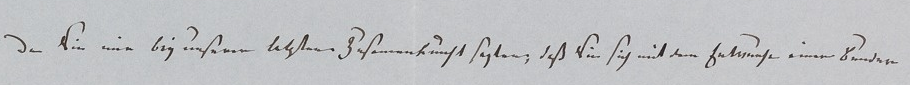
Da Sie mir bey unserer letzten Zusammenkunft sagten, daß Sie sich mit dem Entwurfe eines Bundes
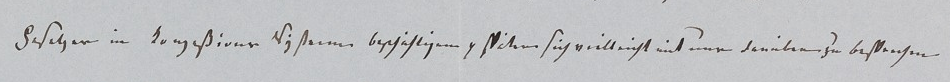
Gesetzes im Konzeßions Systeme beschäftigen & später sich vielleicht mit uns darüber zu besprechen
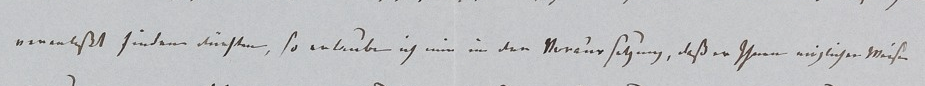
veranlaßt finden dürften, so erlaube ich mir in der Voraussetzung, daß es Ihnen möglicher Weise
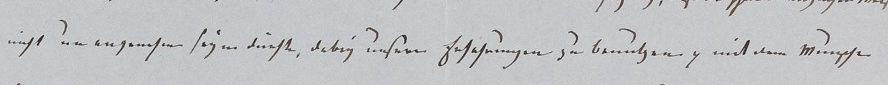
nicht unangenehm seyn dürfte, dabey unsere Erfahrungen zu benutzen & mit dem Wunsche
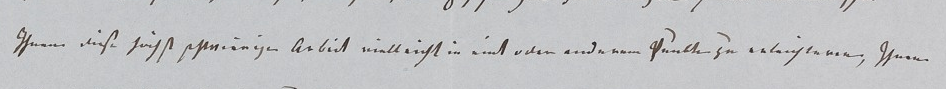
Ihnen diese höchst schwierige Arbeit vielleicht in eint oder anderem Punkte zu erleichteren, Ihnen
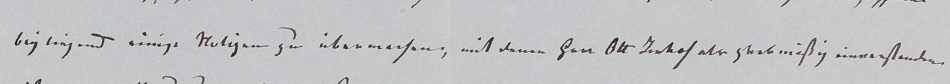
beyliegend einige Notizen zu übermachen, mit denen Herr Ott Imhof als zweckmäßig einverstanden
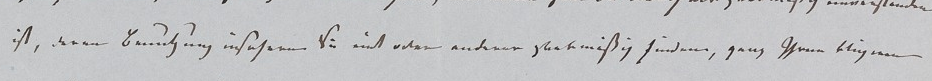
ist, deren Benutzung insofern Sie eint oder anderes zwekmäßig finden, ganz Ihrem klügeren
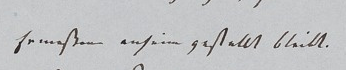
Ermeßen anheim gestellt bleibt.
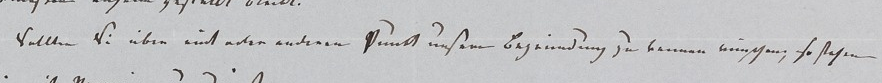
Sollten Sie über eint oder anderen Punkt unsere Begründung zu kennen wünschen, so stehen
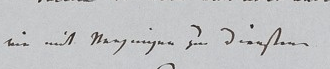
wir mit Vergnügen zu Diensten.
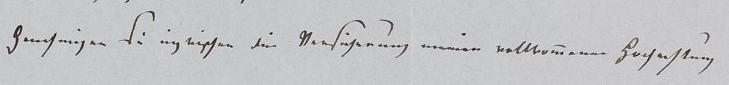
Genehmigen Sie inzwischen die Versicherung meiner vollkommenen Hochachtung
